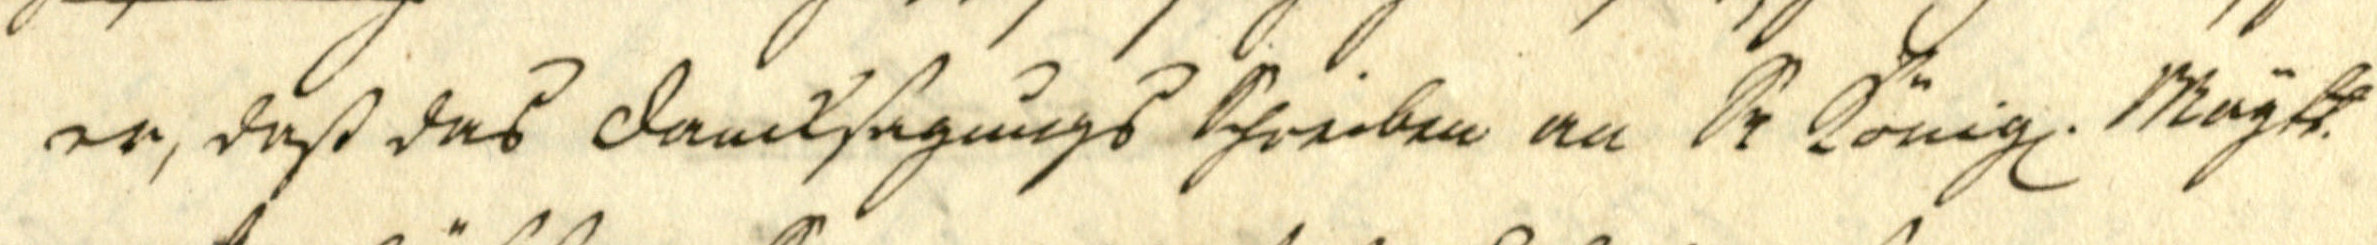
er, daß das Dancksagungs Schreiben an Sr Königl. Maÿtt.
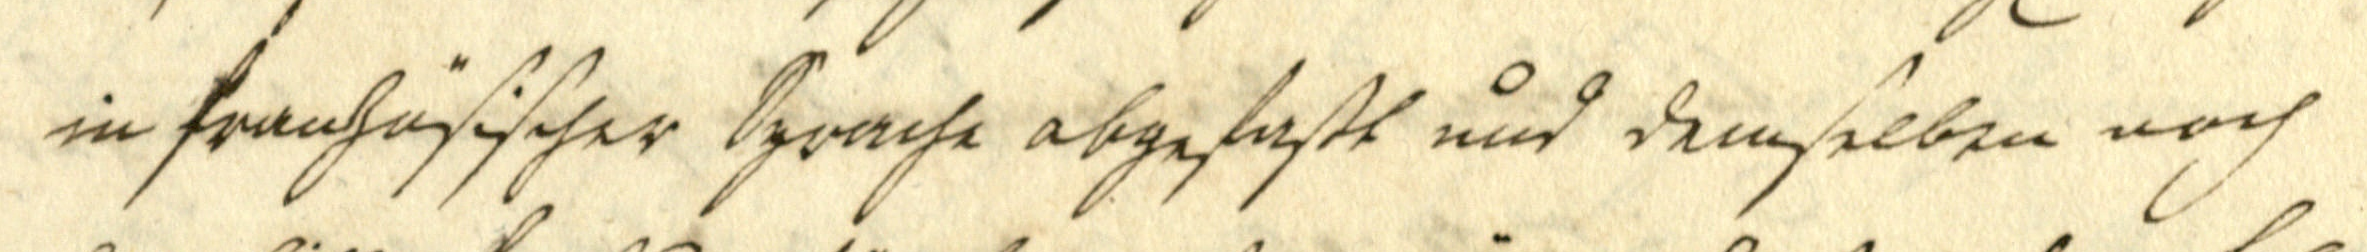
in französischer Sprache abgefaßt und demselben noch
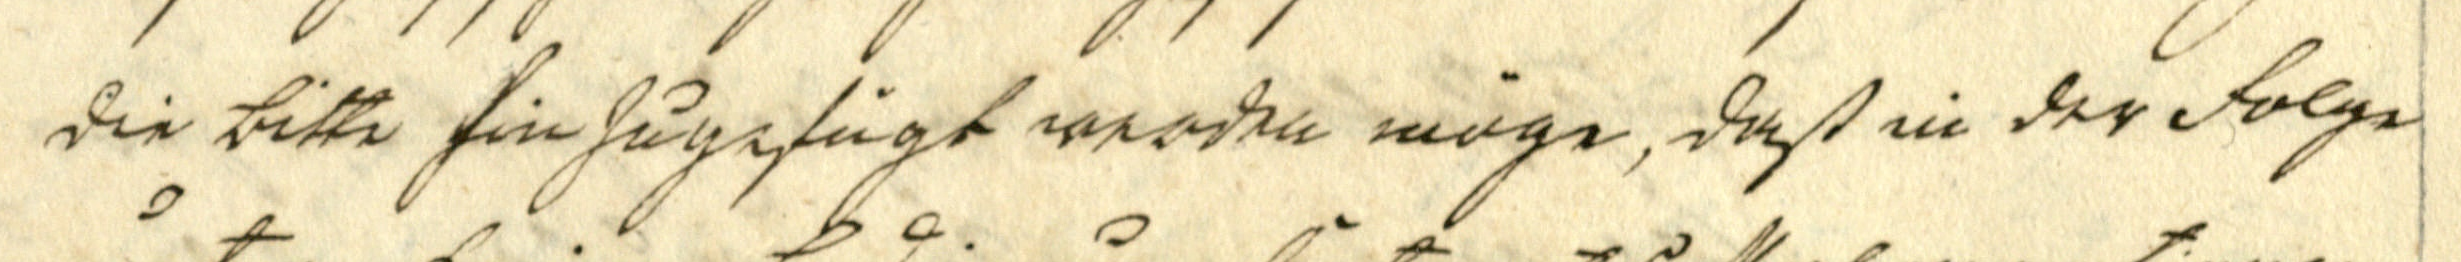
die Bitte hin zugefügt werden möge, daß in der Folge
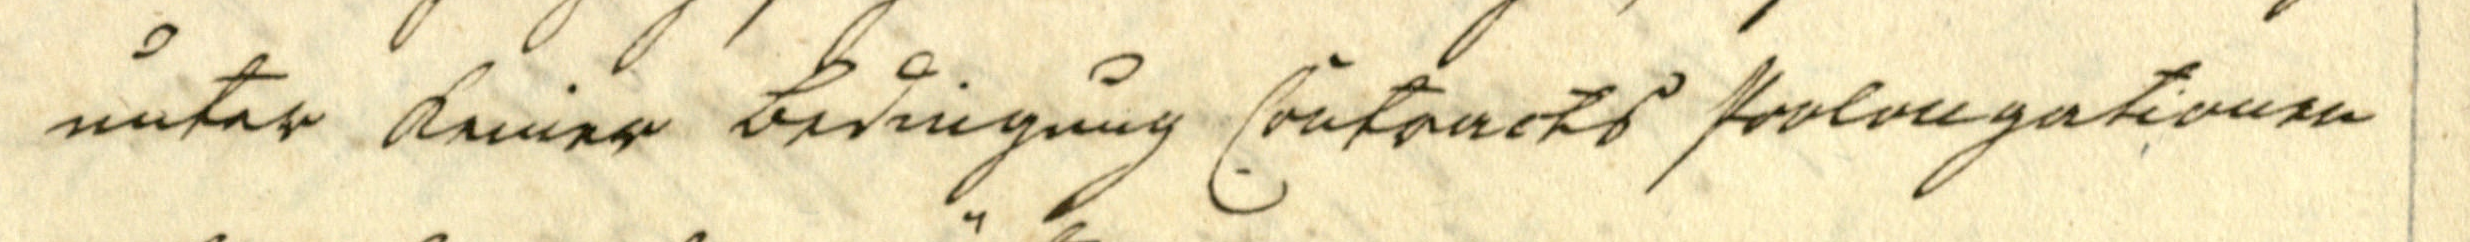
unter keiner Bedingung Contracts Polongationen
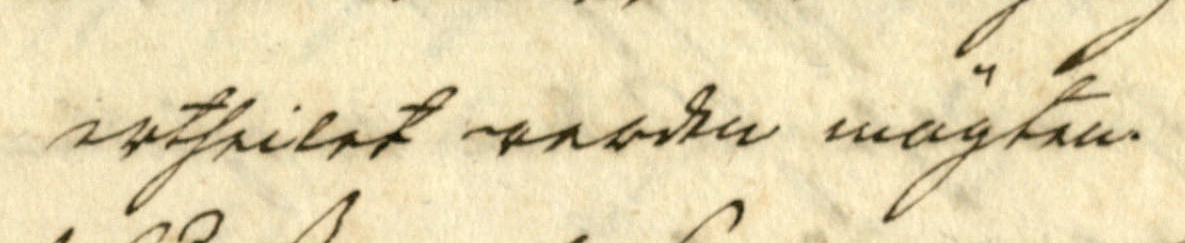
ertheilet werden mögten.
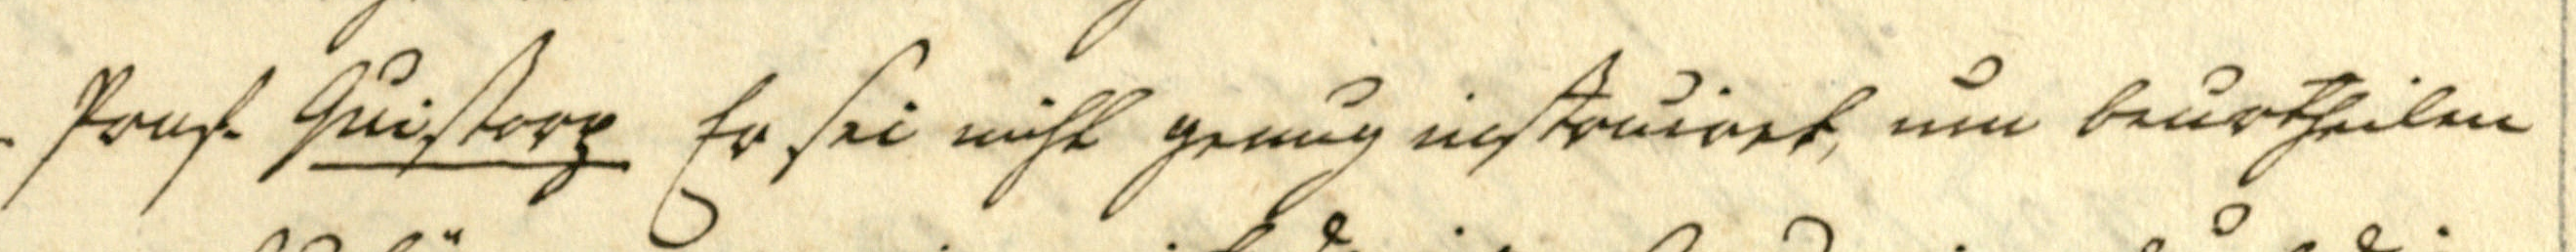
Prof. Quistorp Er sei nicht genug instruiret, um beurtheilen
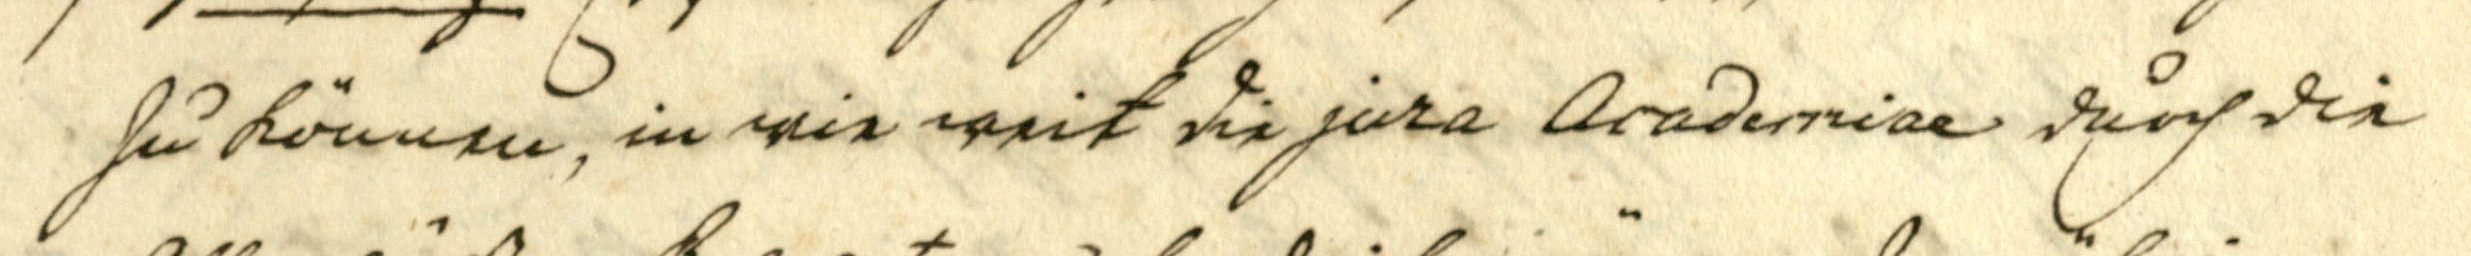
zu können, in wie weit die jura Academiae durch die
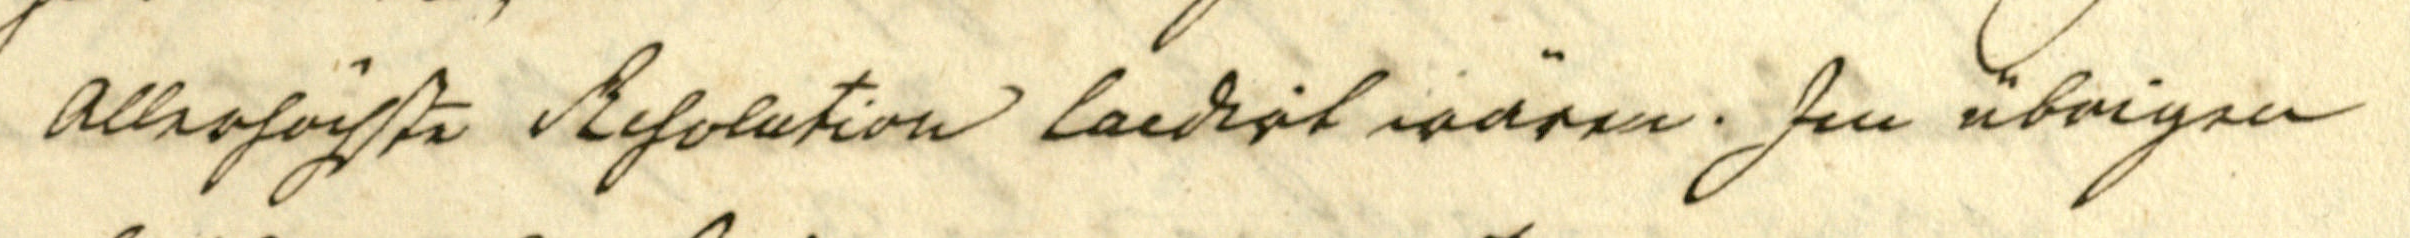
Allerhöchste Resolution laidert wären. Im übrigen
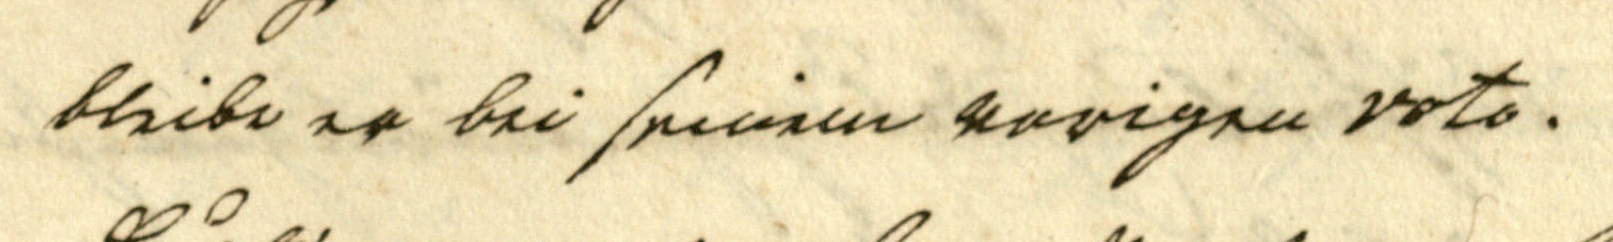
bleibe er bei seinem vorigen voto.
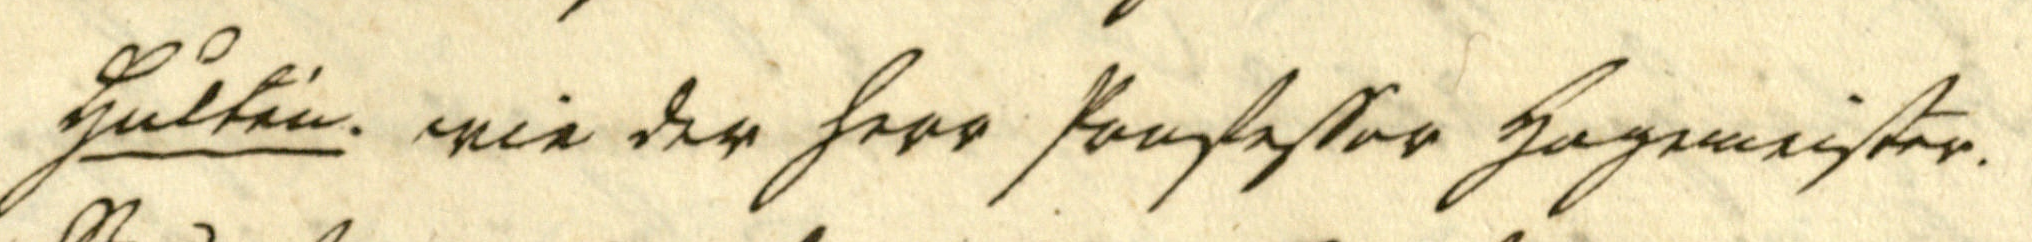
Hultén. wie der Herr Professor Hagemeister.
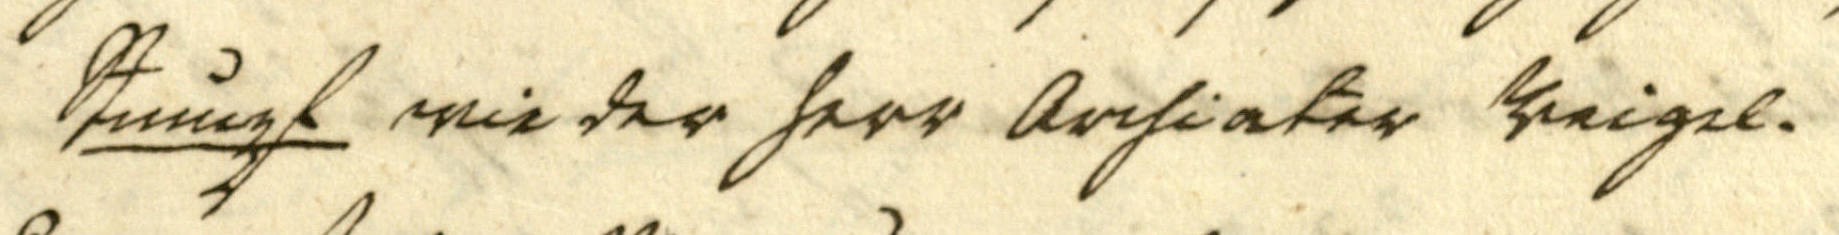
Stumpf. wie der Herr Archiater Weigel.
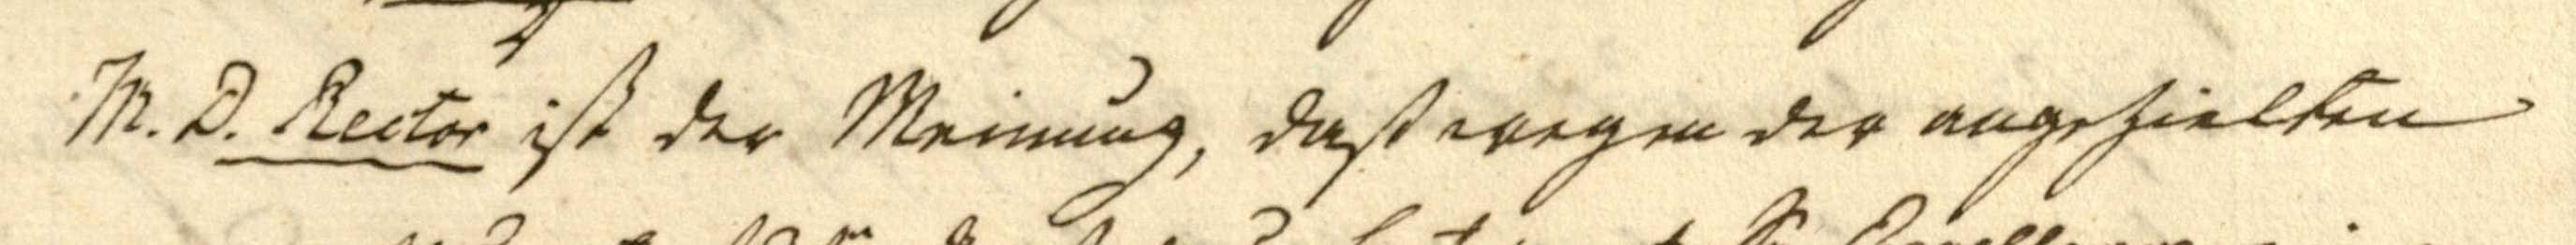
M. D. Rector ist der Meinung, daß wegen der angezielten
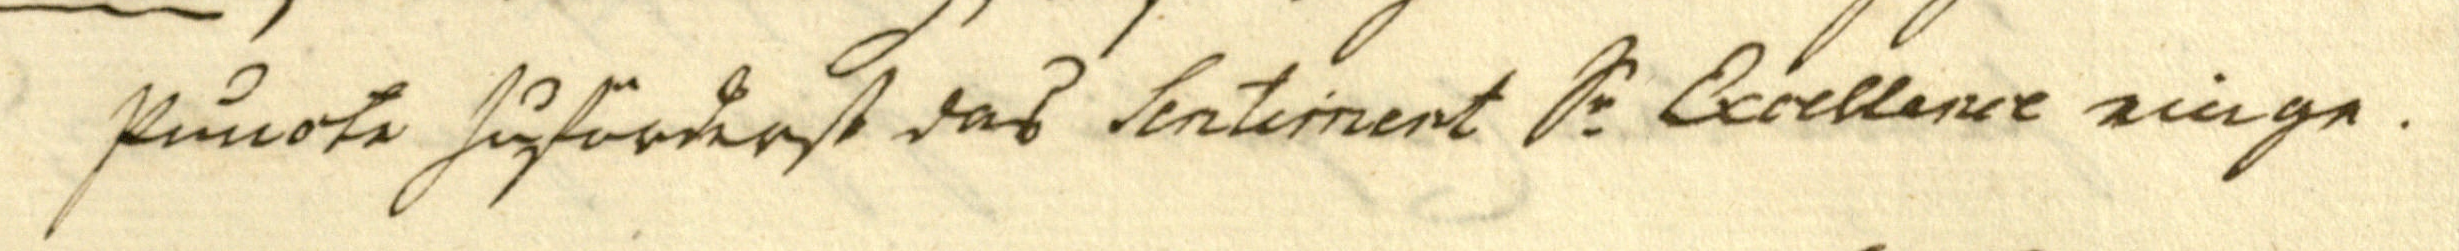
Puncte zuförderst das Sentiment Sr. Excellence einge¬
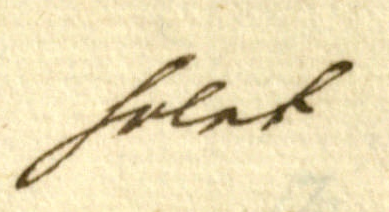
holet
